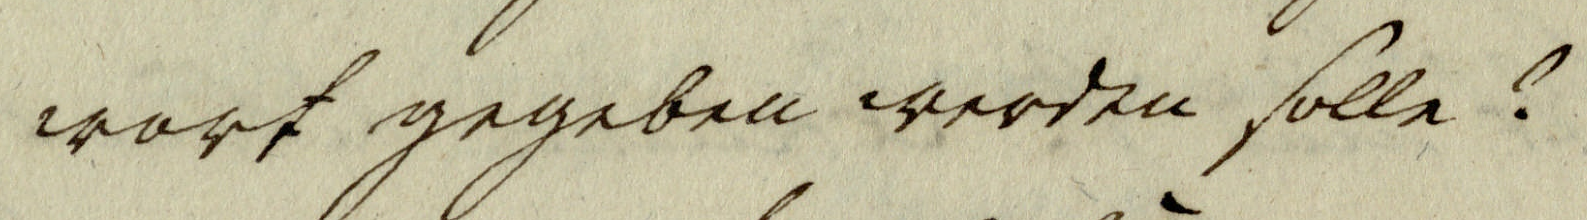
wort gegeben werden solle?
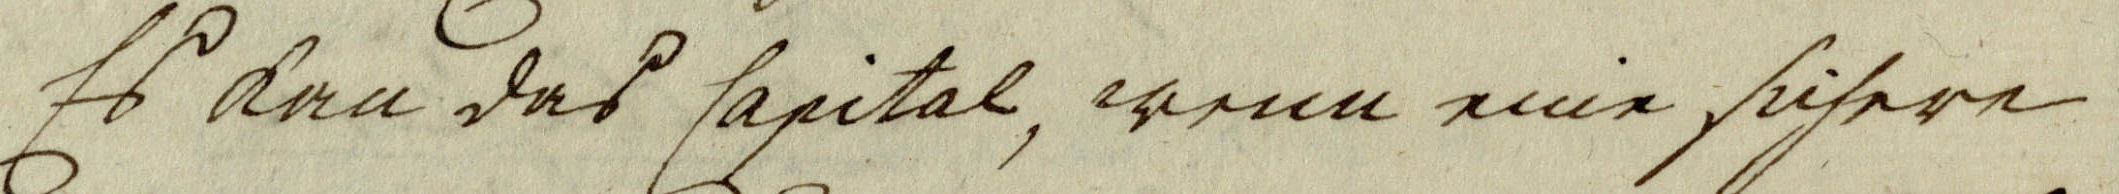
Es kan das Capital, wenn eine sichere
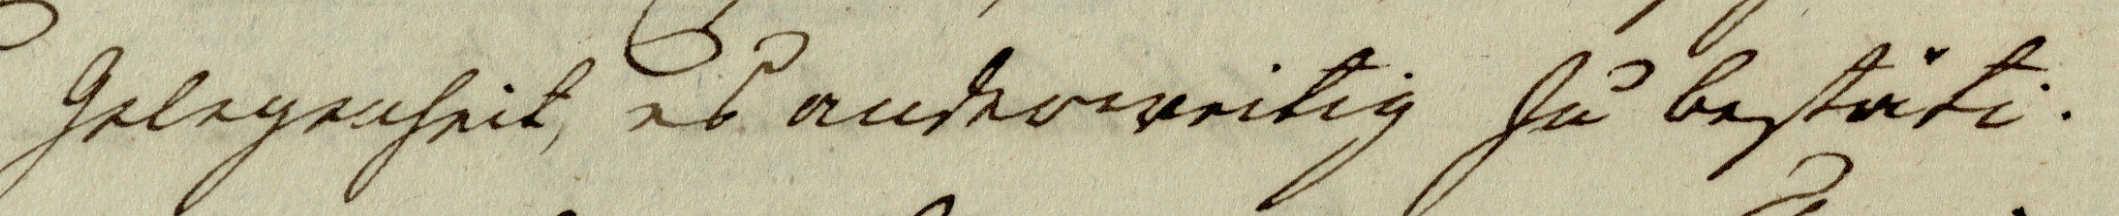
Gelegenheit, es anderweitig zu bestäti¬
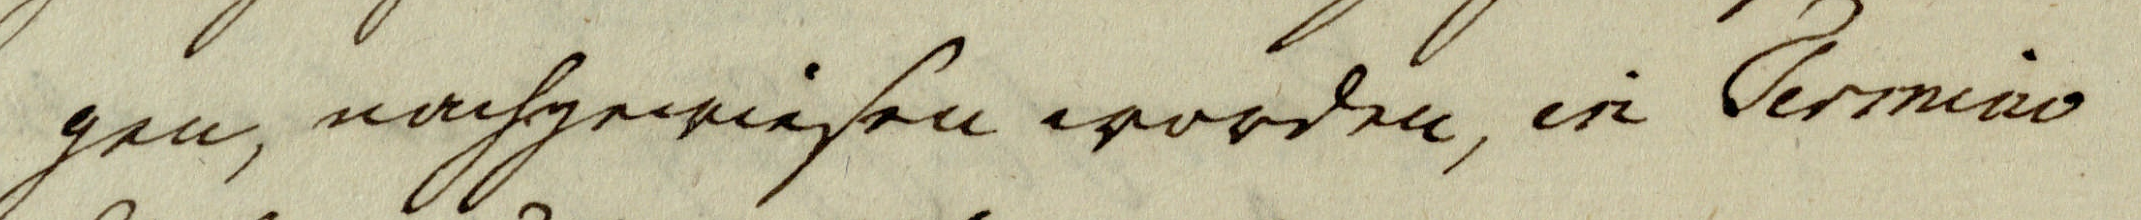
gen, nachgewiesen worden, in Termino
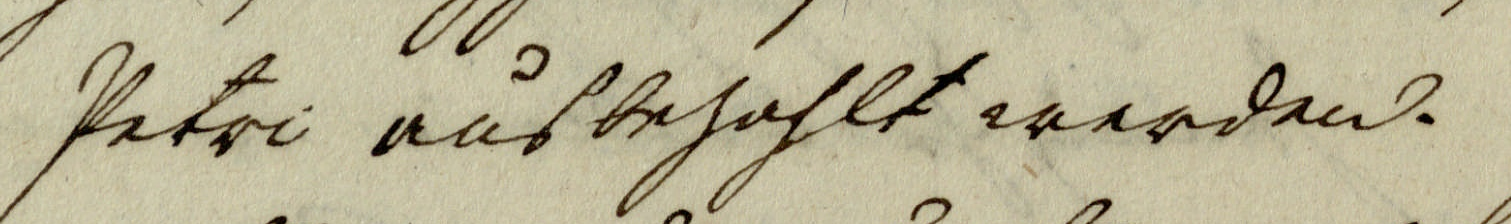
Petri ausbezahlt werden.
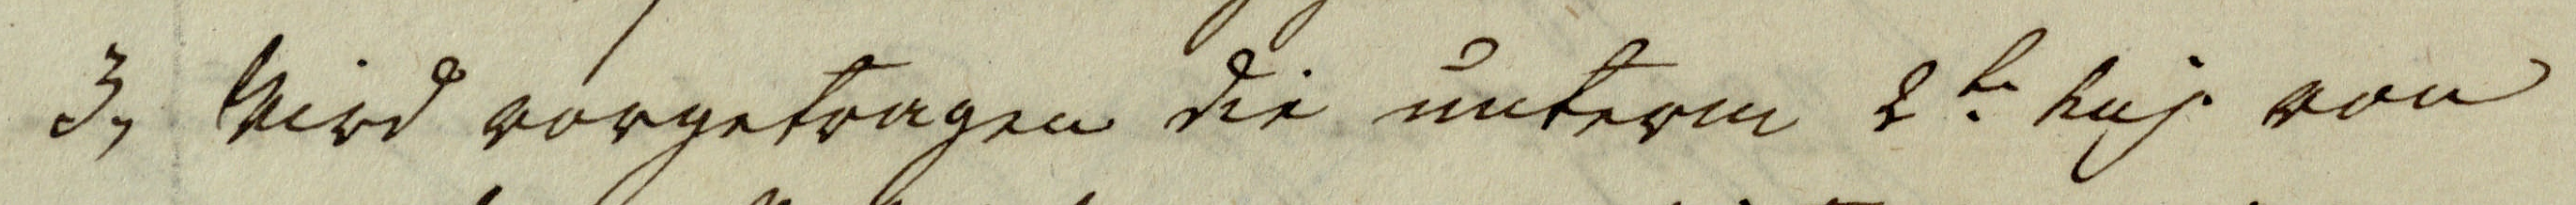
3., Wird vorgetragen die unterm 2t. huj. von
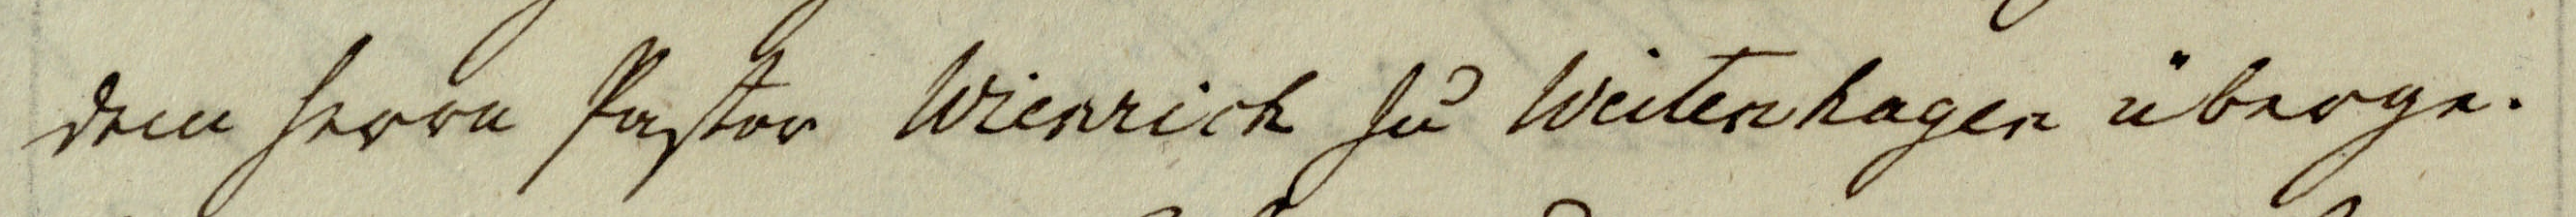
dem Herrn Pastor Wienrich zu Weitenhagen überge¬
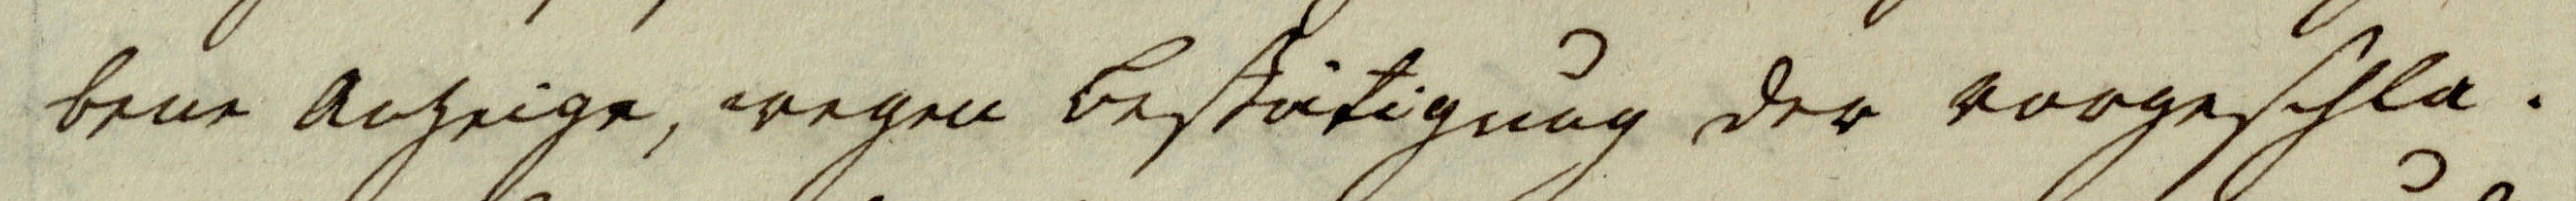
bene Anzeige, wegen Bestätigung der vorgeschla¬
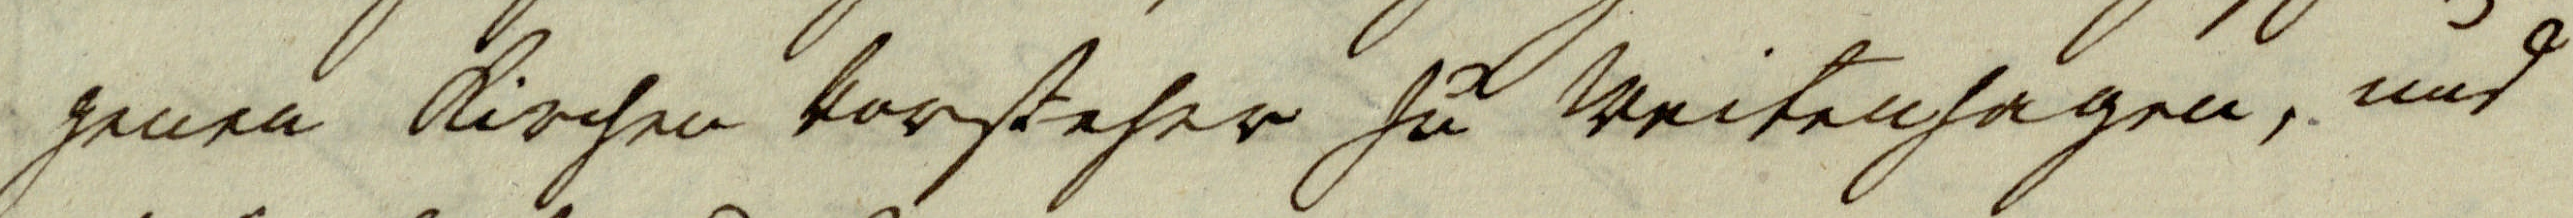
genen Kirchen Vorsteher zu Weitenhagen, und
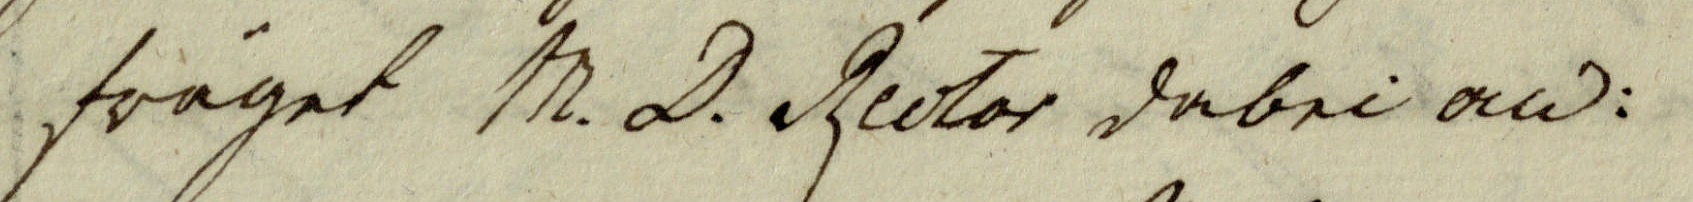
fräget M. D. Rector dabei an:
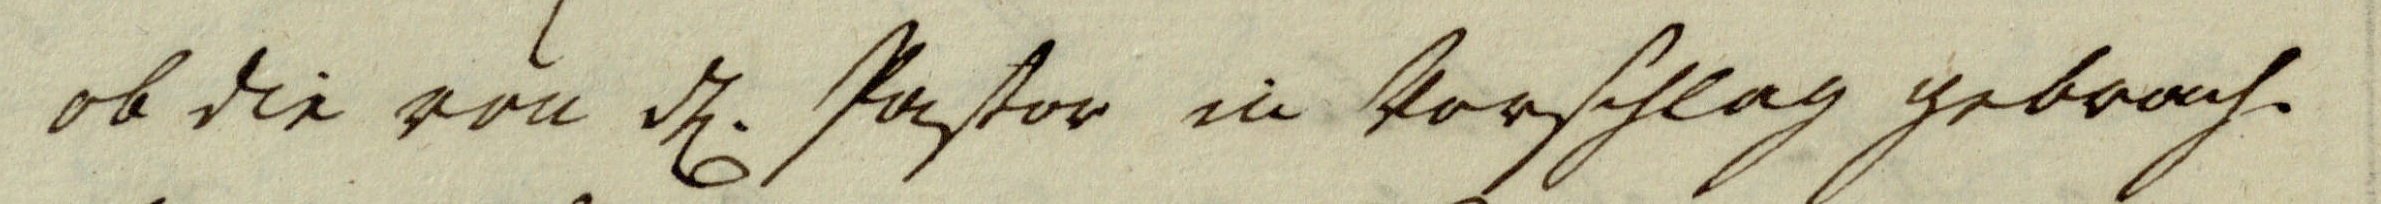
ob die von dh. Pastor in Vorschlag gebrach¬
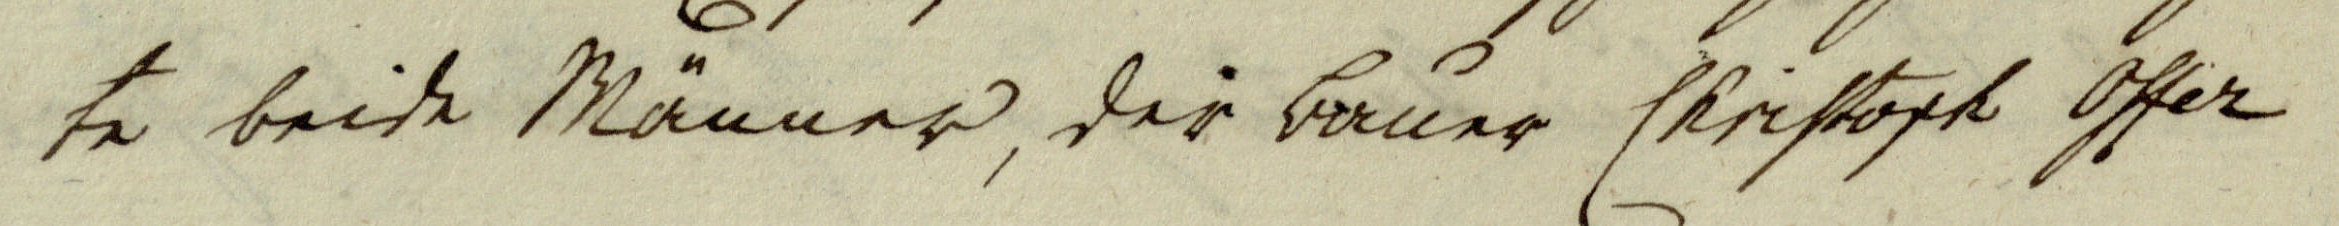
te beide Männer, der Bauer Christoph Oster
